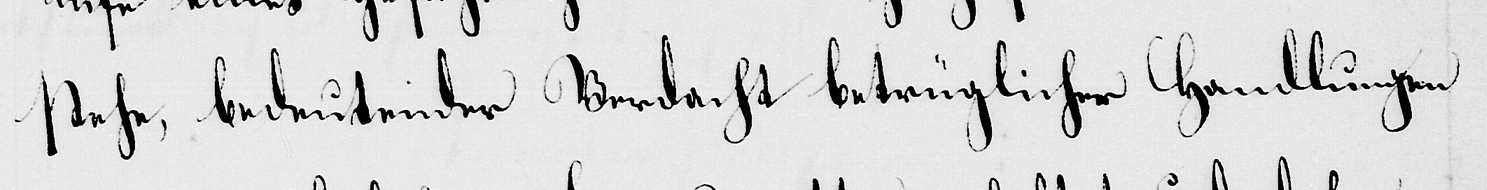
stehe, bedeutender Verdacht betrüglicher Handlungen
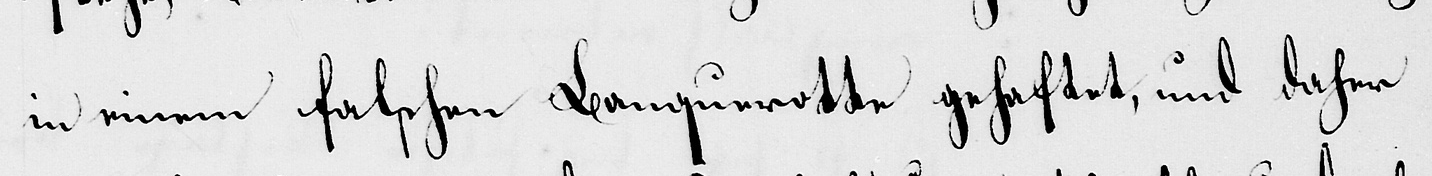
in einem falschen Banquerotte gehaftet, und daher
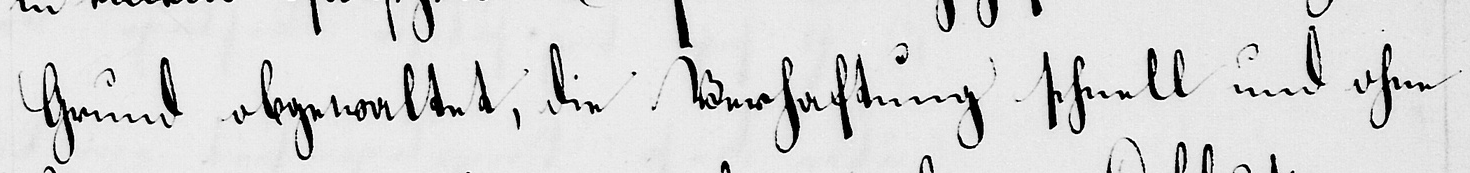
Grund obgewaltet, die Verhaftung schnell und ohne
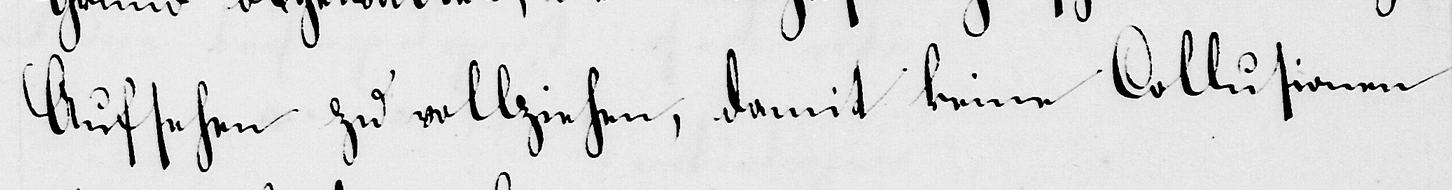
Aufsehen zu vollziehen, damit keine Collusionen
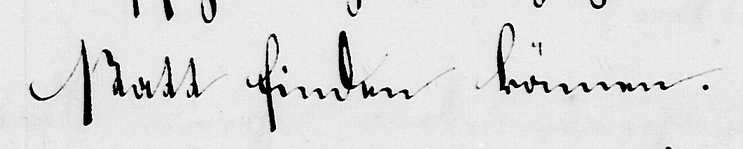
statt finden können.
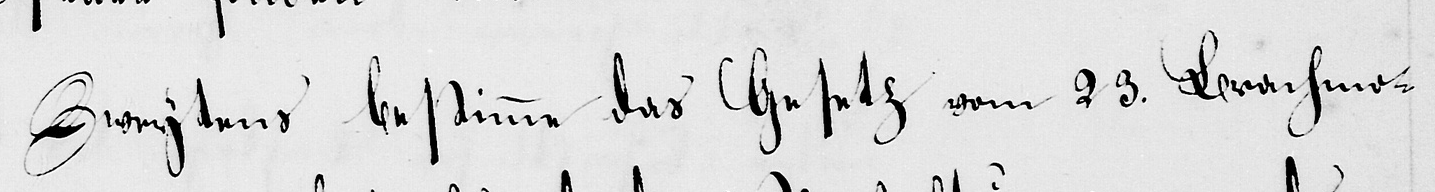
Zweytens bestimme das Gesetz vom 23. Brachmo¬
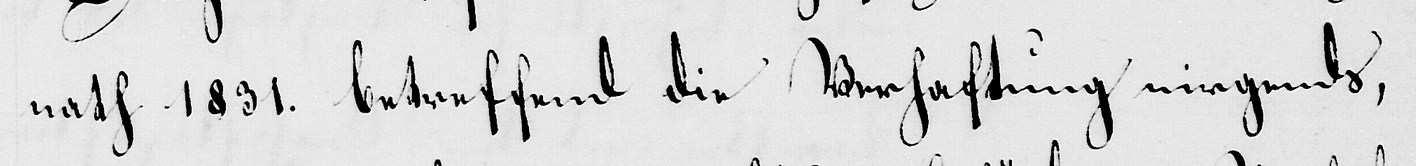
nath 1831. betreffend die Verhaftung nirgends,
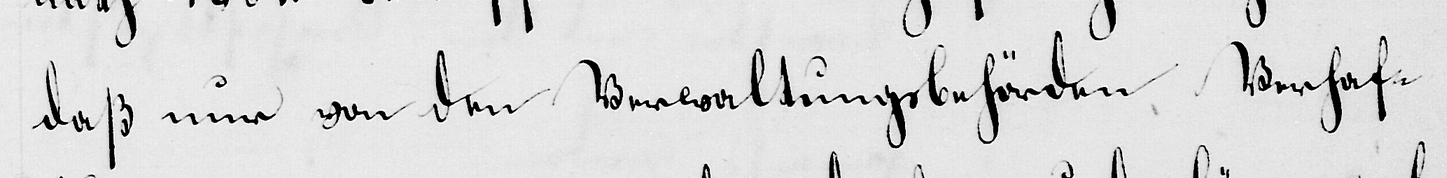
daß nur von den Verwaltungsbehörden Verhaf¬
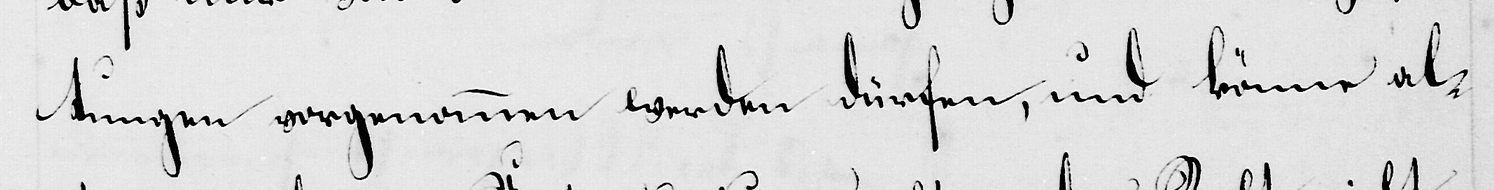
tungen vorgenommen werden dürfen, und könne al¬
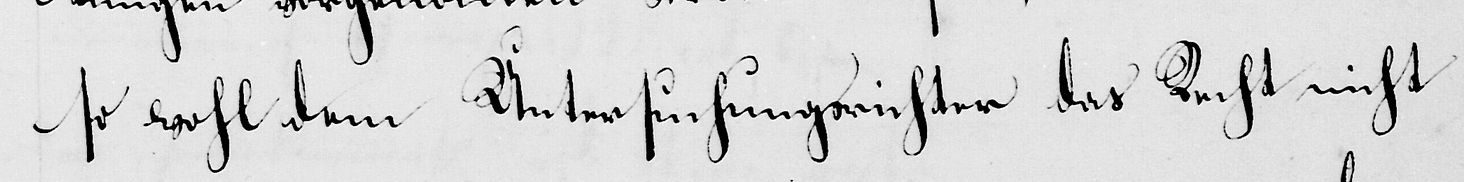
so wohl dem Untersuchungsrichter das Recht nicht
